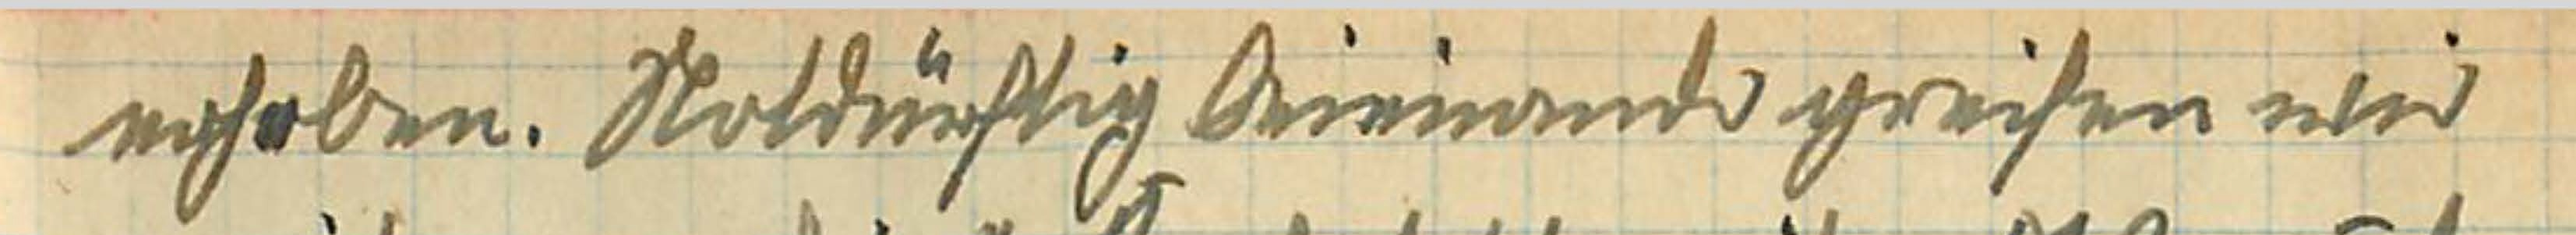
erheben. Notdürftig beieinander greifen wir
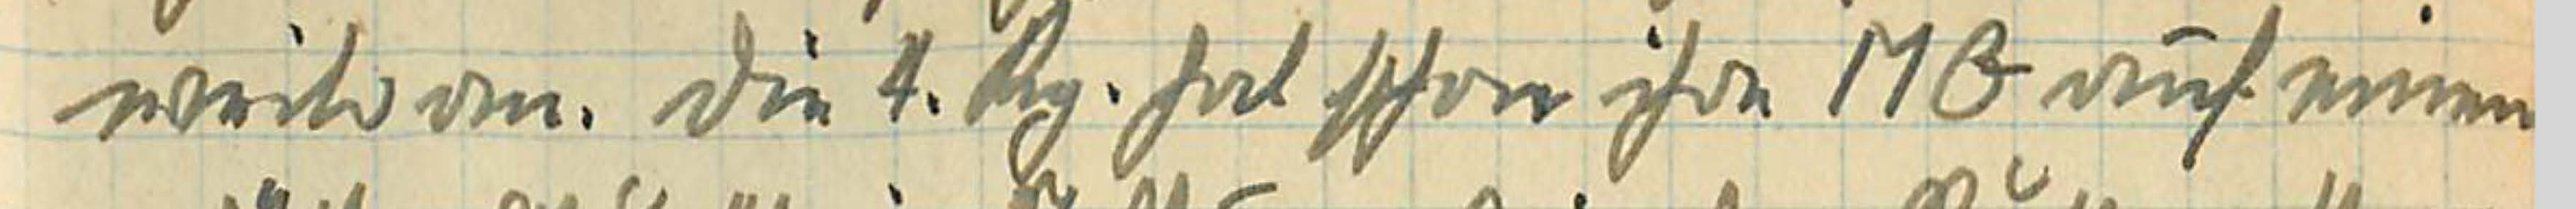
weiter an. Die 4. Kp. hat schon ihre MG auf einem
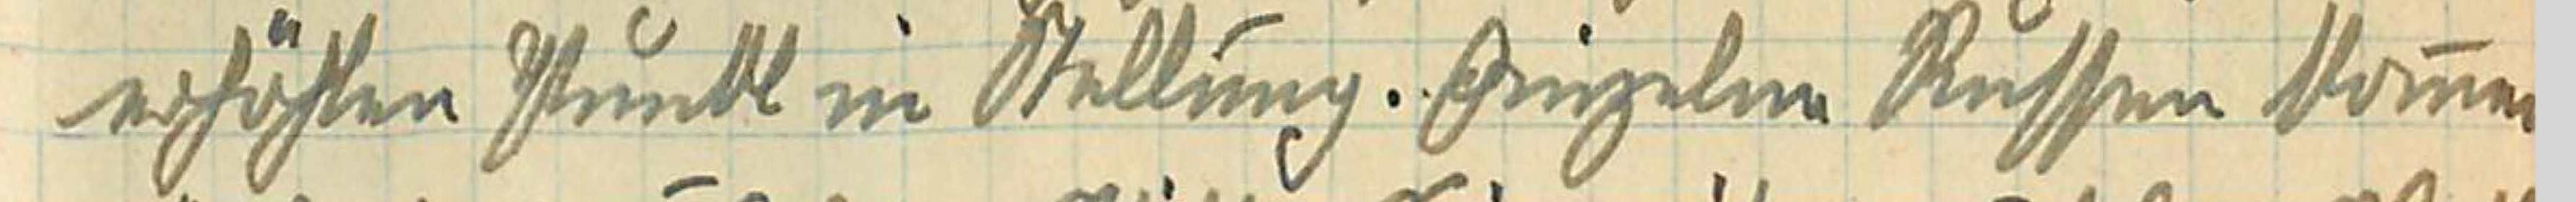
erhöhten Punkt in Stellung. Einzelne Russen kommen
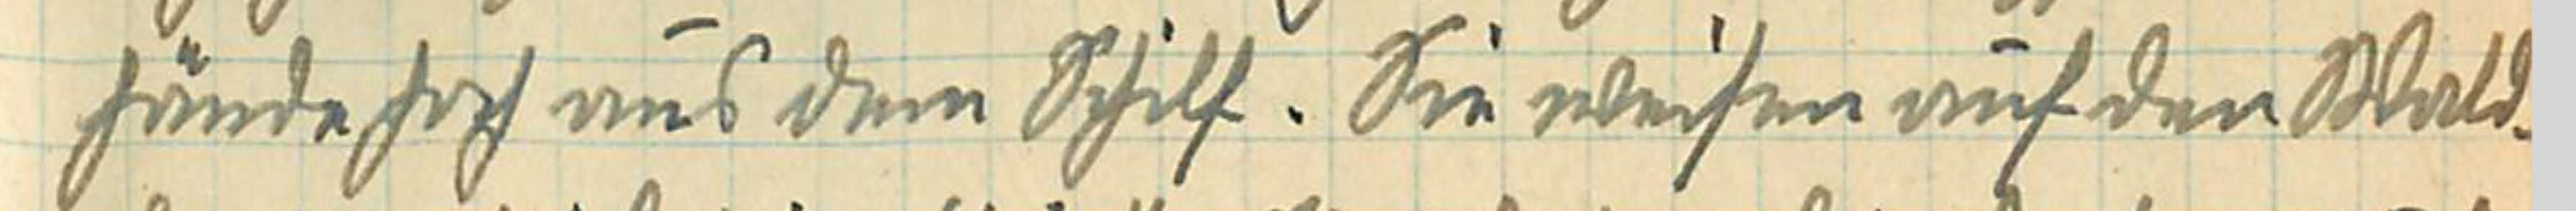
hände hoch aus dem Schilf. Sie weisen auf den Wald.
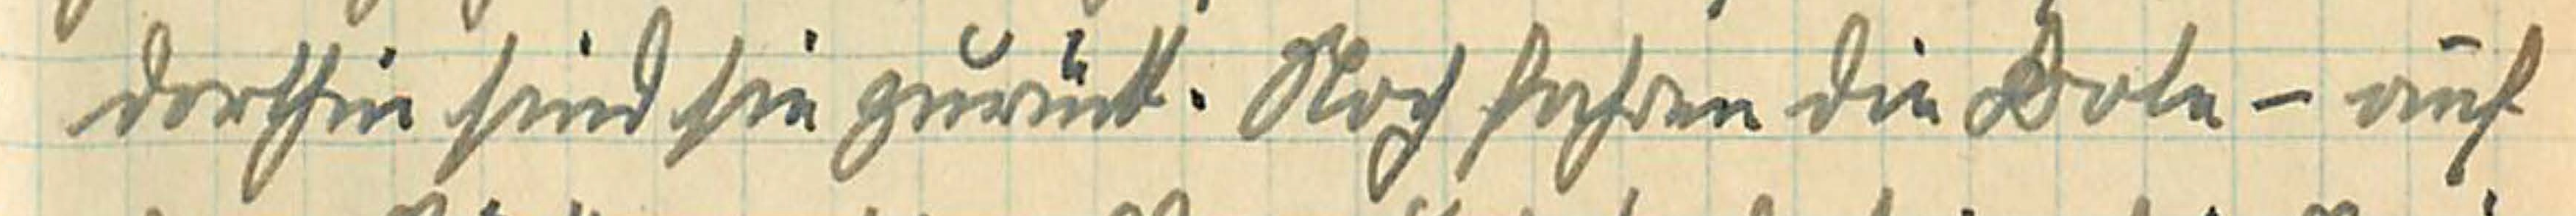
dorthin sind sie zurück. Noch fahren die Bote – auf
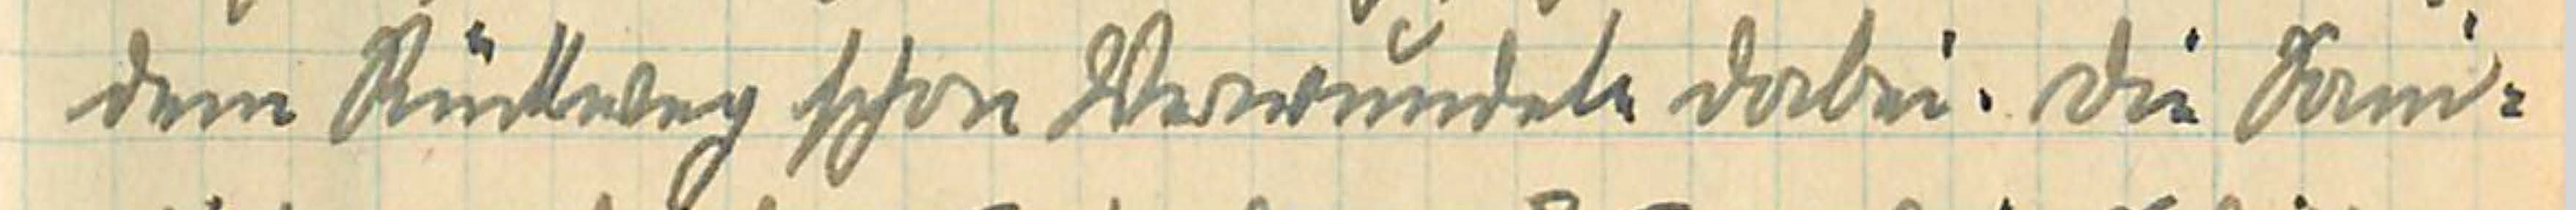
dem Rückweg schon Verwundete dabei. Die Sani-
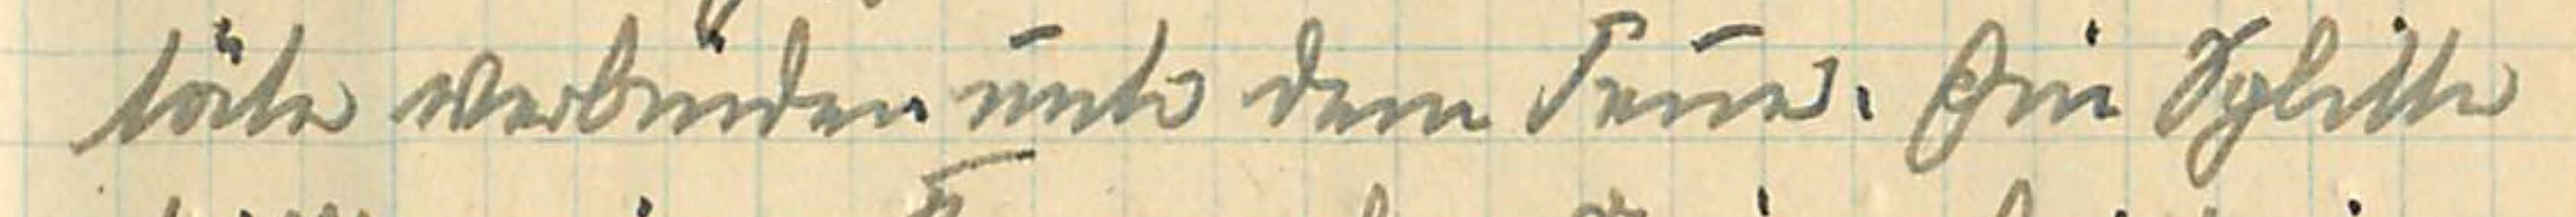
täter verbinden unter dem Feuer. Ein Splitter
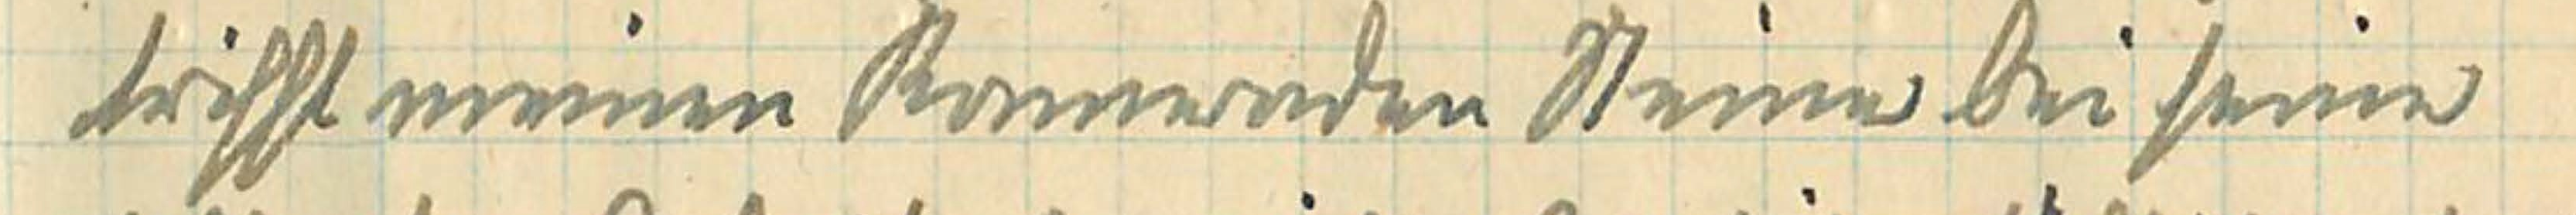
trifft meinen Kameraden Steiner bei seiner
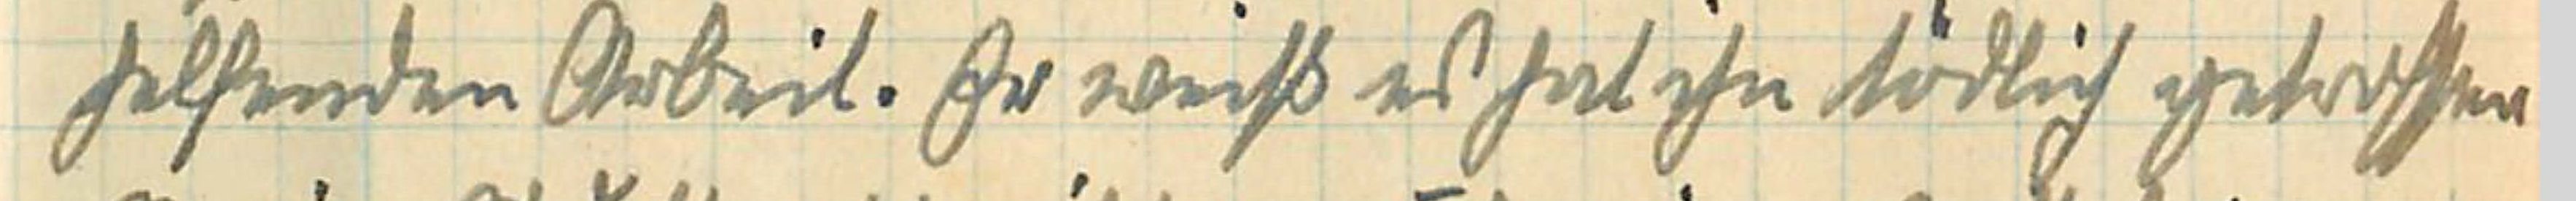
helfenden Arbeit. Er weiß es hat ihn tödlich getroffen.
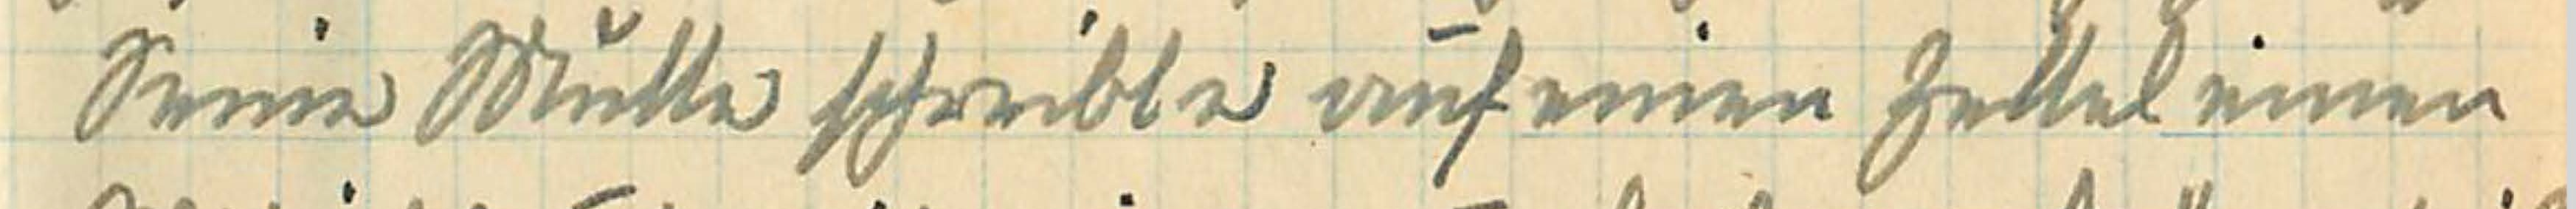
Seiner Mutter schreibt er auf einen Zettel einen
